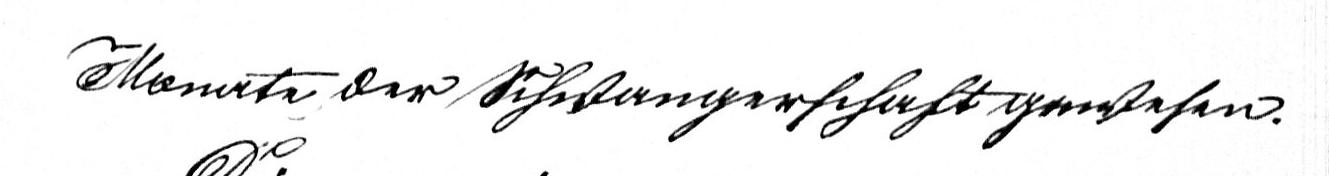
Monate der Schwangerschaft gewesen.
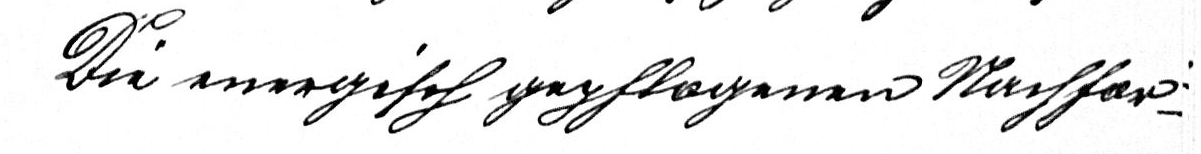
Die energisch gepflogenen Nachfor¬
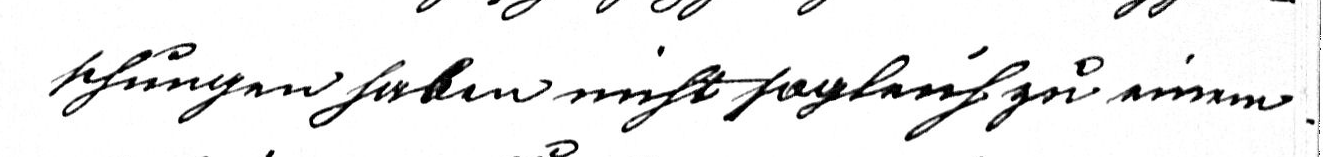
schungen haben nicht sogleich zu einem¬
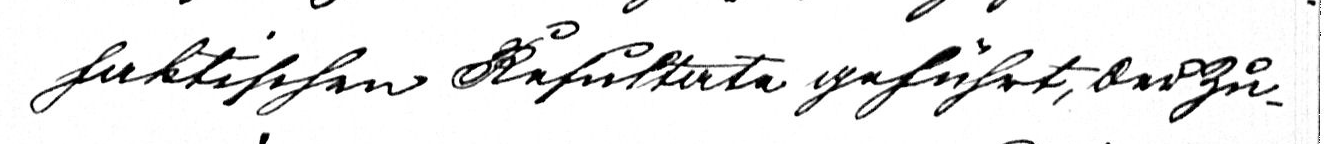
faktischen Resultate geführt, der Zu¬
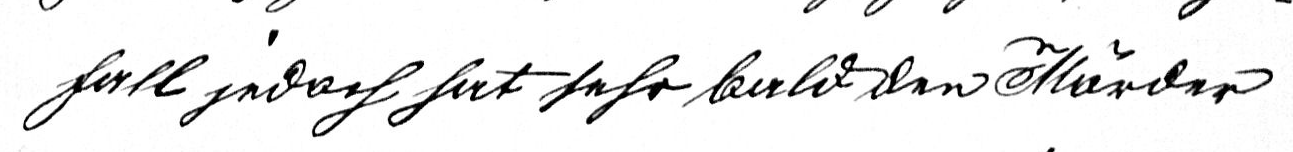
fall jedoch hat sehr bald den Mörder
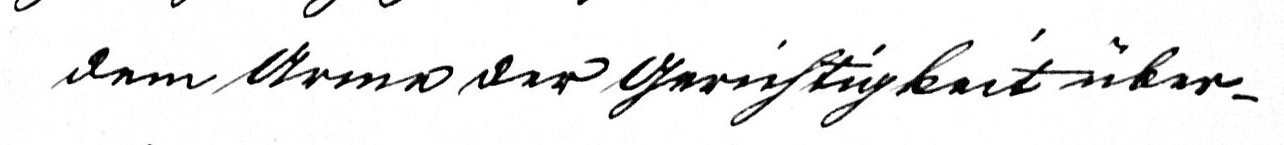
dem Arme der Gerichtigkeit über¬
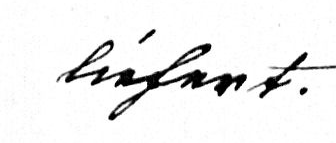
liefert.
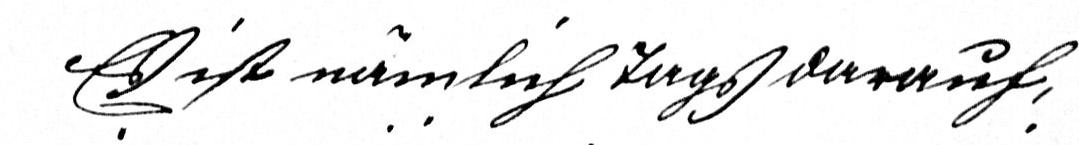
Esist nämlich Tags darauf,
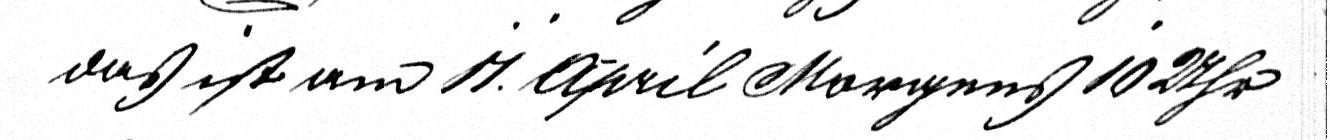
das ist am 11. April Morgens 10 Uhr
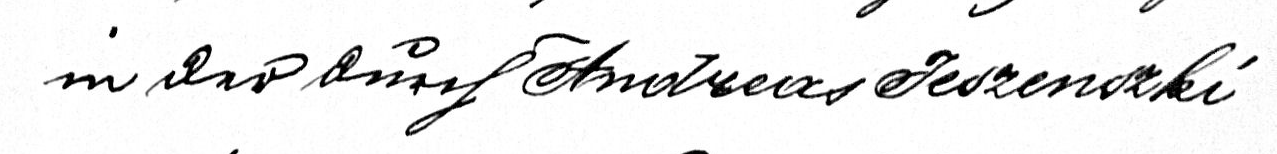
in der durch Andreas Jeszenszki¬
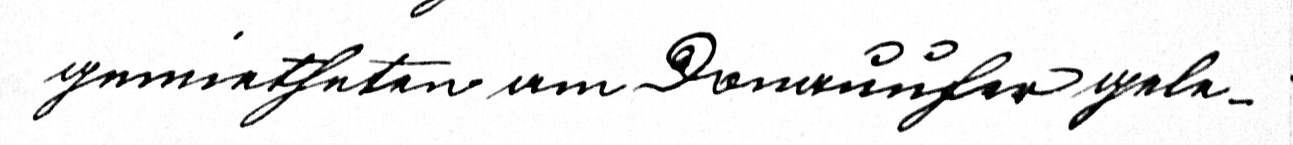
gemietheten am Donauufer gele¬
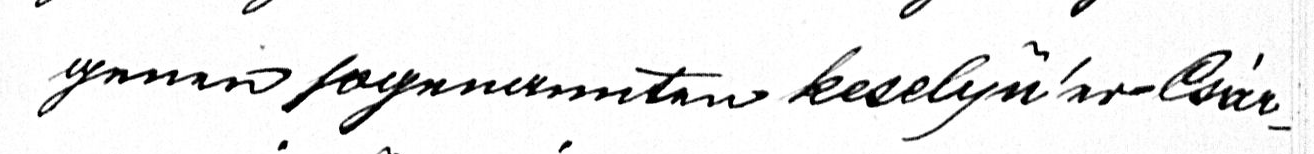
genen sogenannten keselÿn'er Csár¬
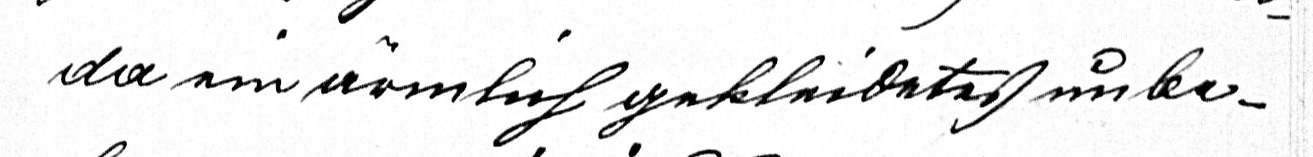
da ein ärmlich gekleidetes unbe¬
